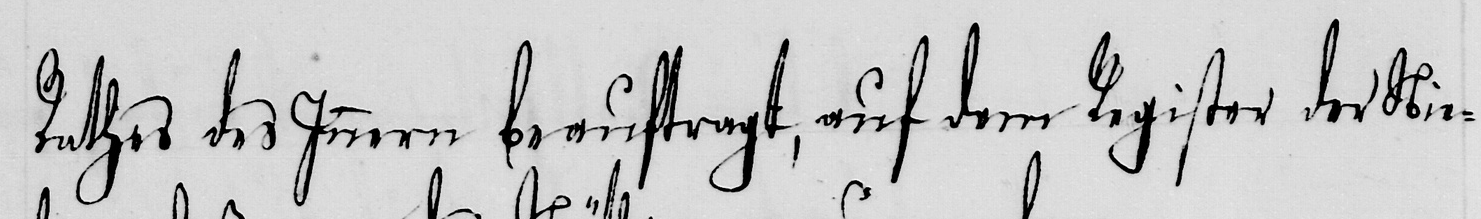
Rathes des Innern beauftragt, auf dem Register der Nie¬
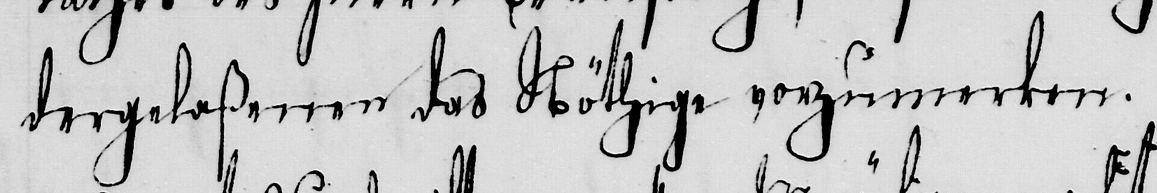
dergelaßenen das Nöthige vorzunehmen.
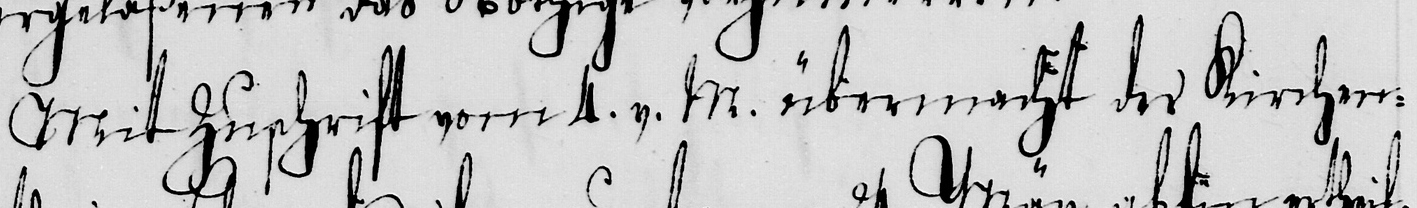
Mit Zuschrift vom 4. v. M. übermacht der Kirchen¬
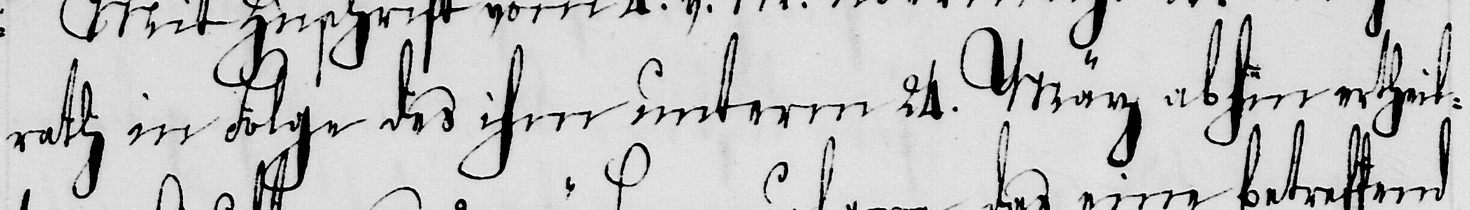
rath in Folge des ihm unterm 24. May abhin ertheil¬
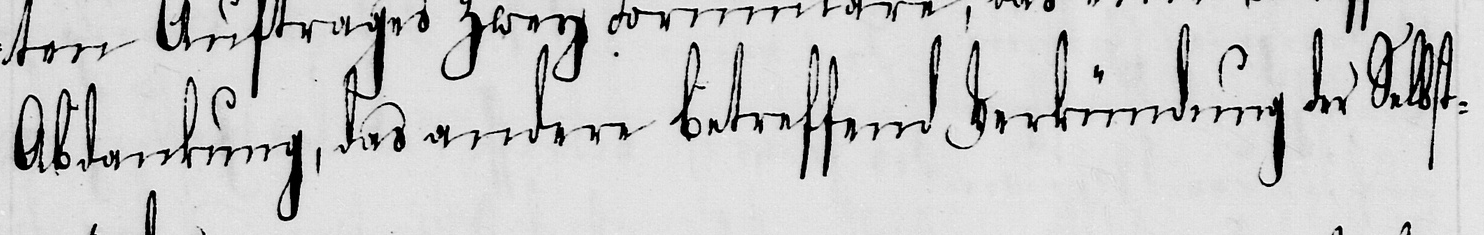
Abdankung, das andere betreffend Verkündung der Selbs¬
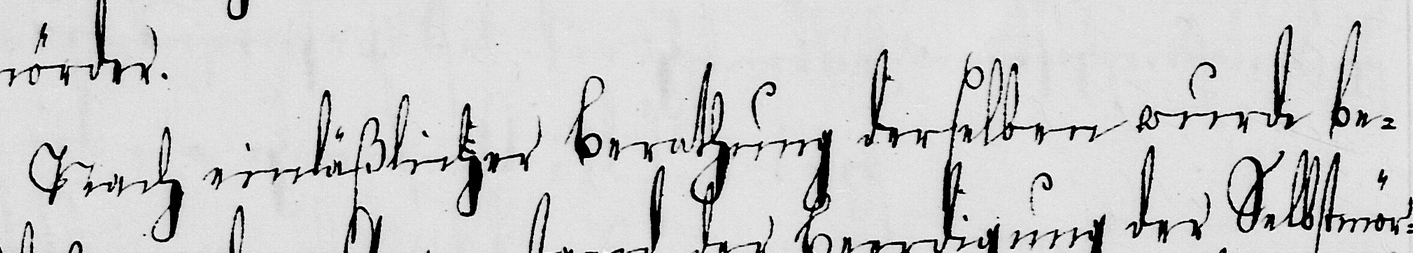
Nach einläßlicher Berathung derselben wurde be¬
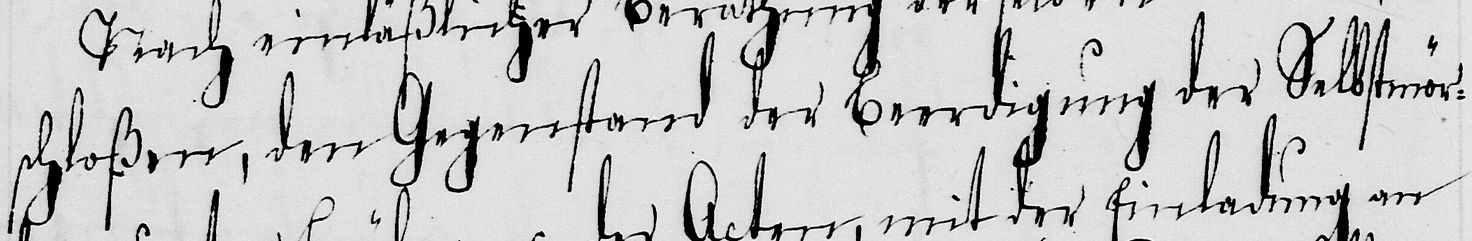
schloßen, den Gegenstand der Beerdigung der Selbstm¬
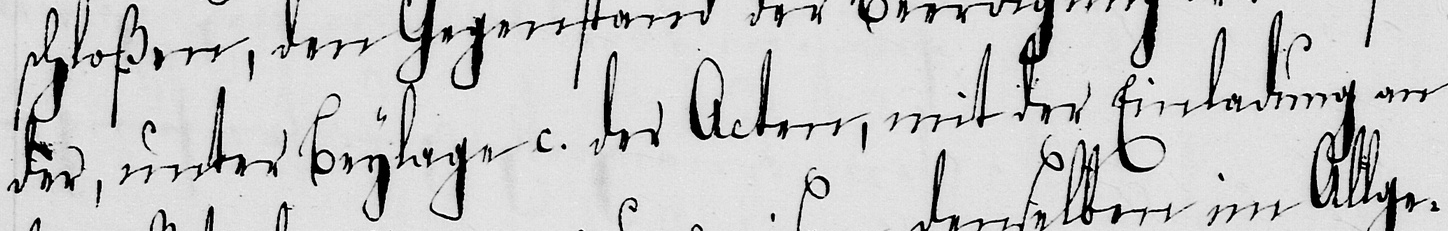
der, unter Beylage c. der Acten, mit der Einladung an
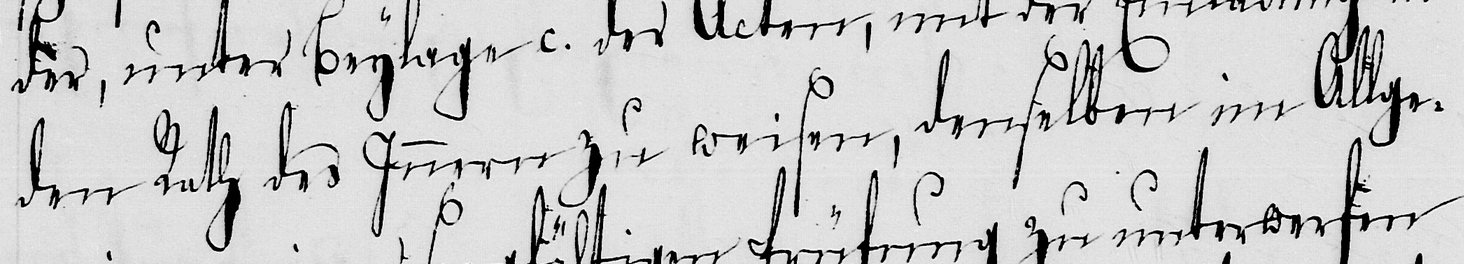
den Rath des Innern zu weisen, denselben im Allge¬
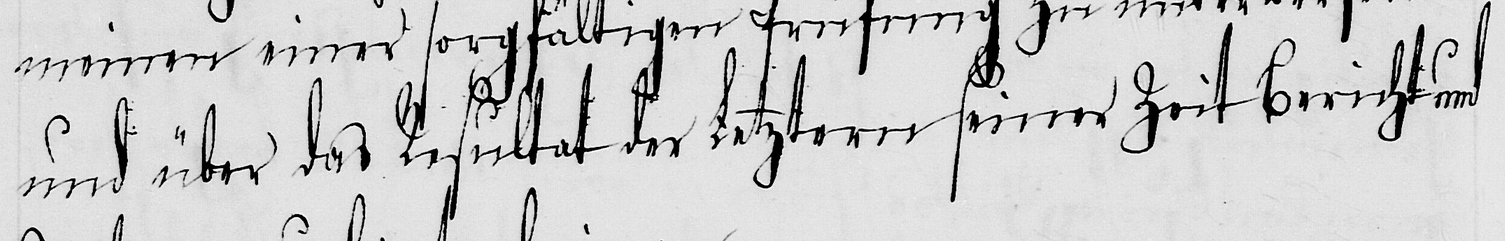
und über das Resultat der Letztern seiner Zeit Bericht
